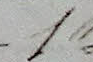1
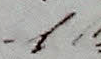1
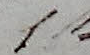1
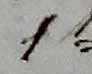1
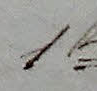1
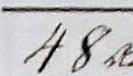48
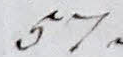57
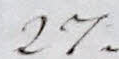27
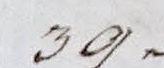39
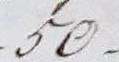50
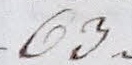63
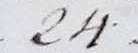24
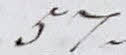57
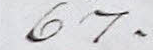67
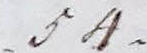54
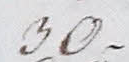30.
